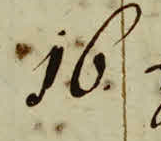16.
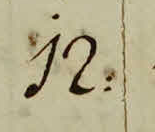12:
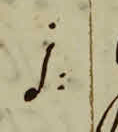1:
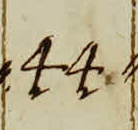44
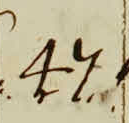47.
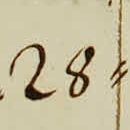28
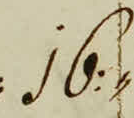16:
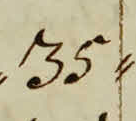35
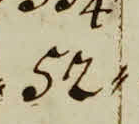52
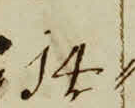14
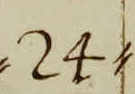24
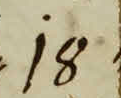18
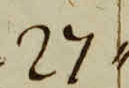27
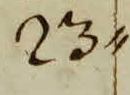23
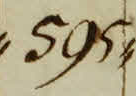595
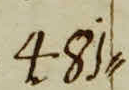481
